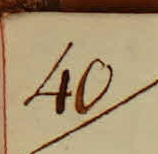40
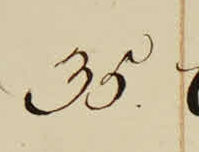35.
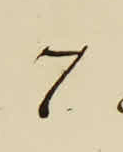7.
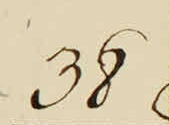38
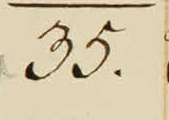35.
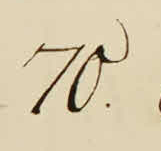70.
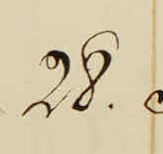28.
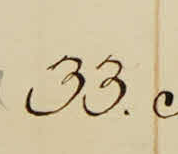33.
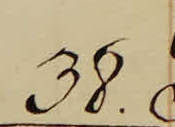38.
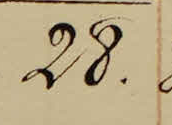28.
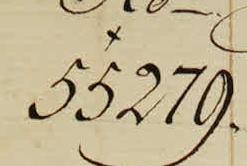55279
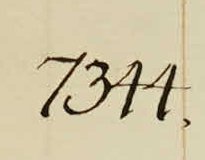7344
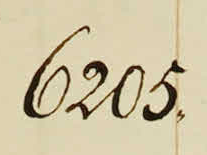6205
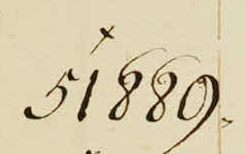51889
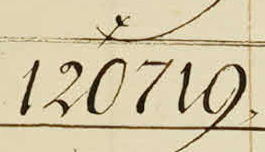120719
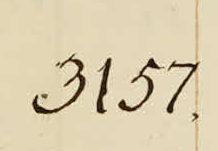3157
